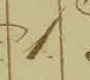1.
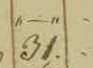31.
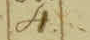4.
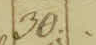30.
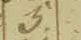5.
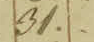31.
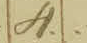4.
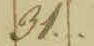31.
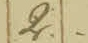2.
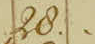28.
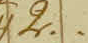2.
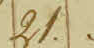21.
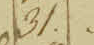31.
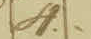4.
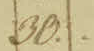30.
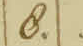8.
